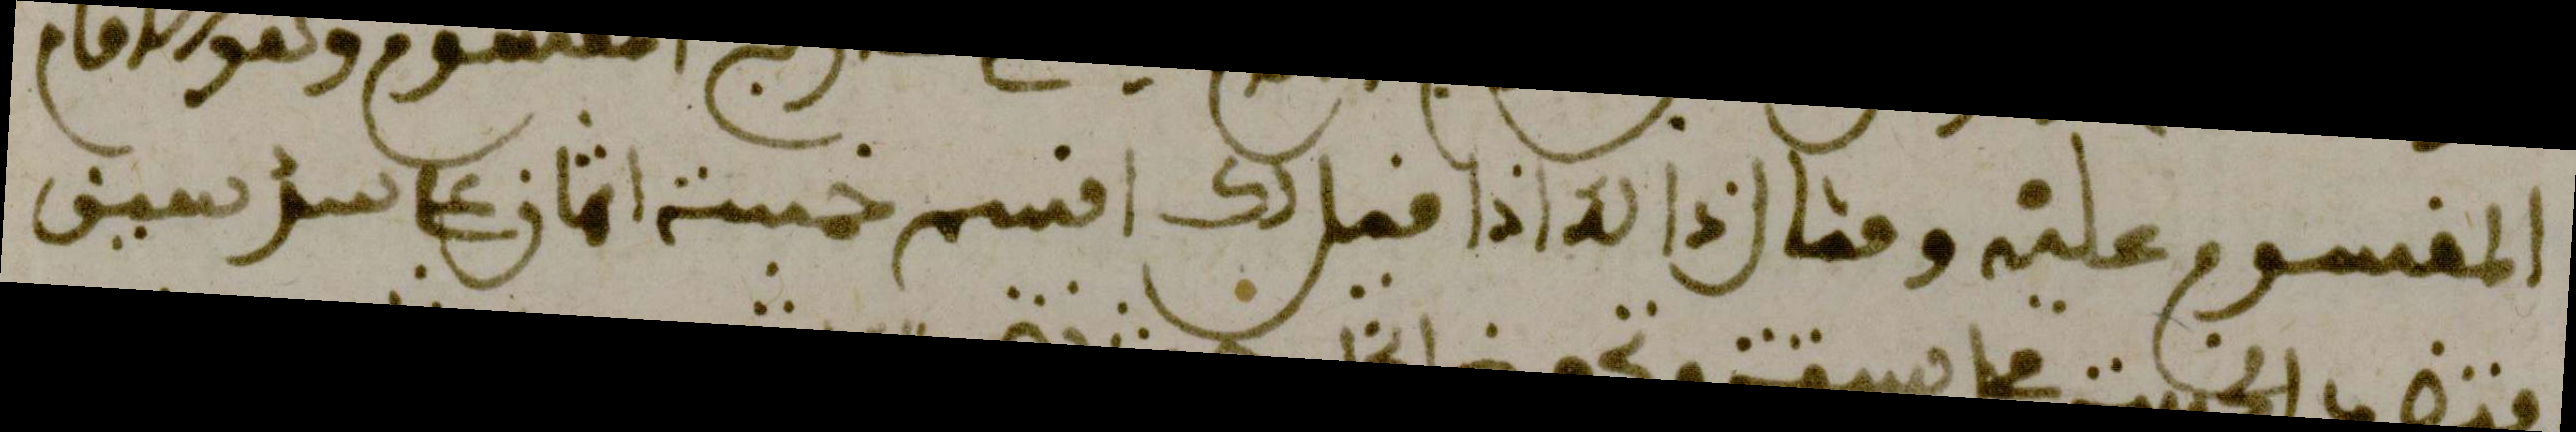المقسوم عليه و مثال ذالك اذا قيل لك اقسم خمسة اثمان على سدسين
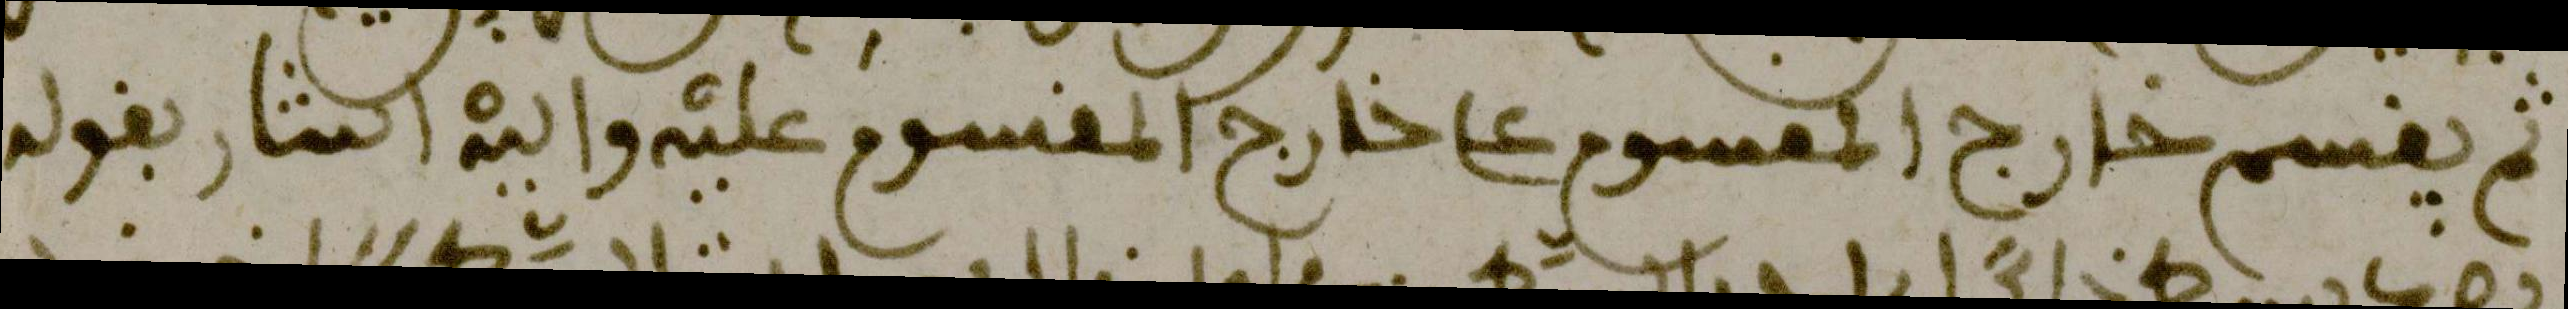ثم يقسم خارج المقسوم عن خارج المقسوم عليه و اليه اشار بقوله
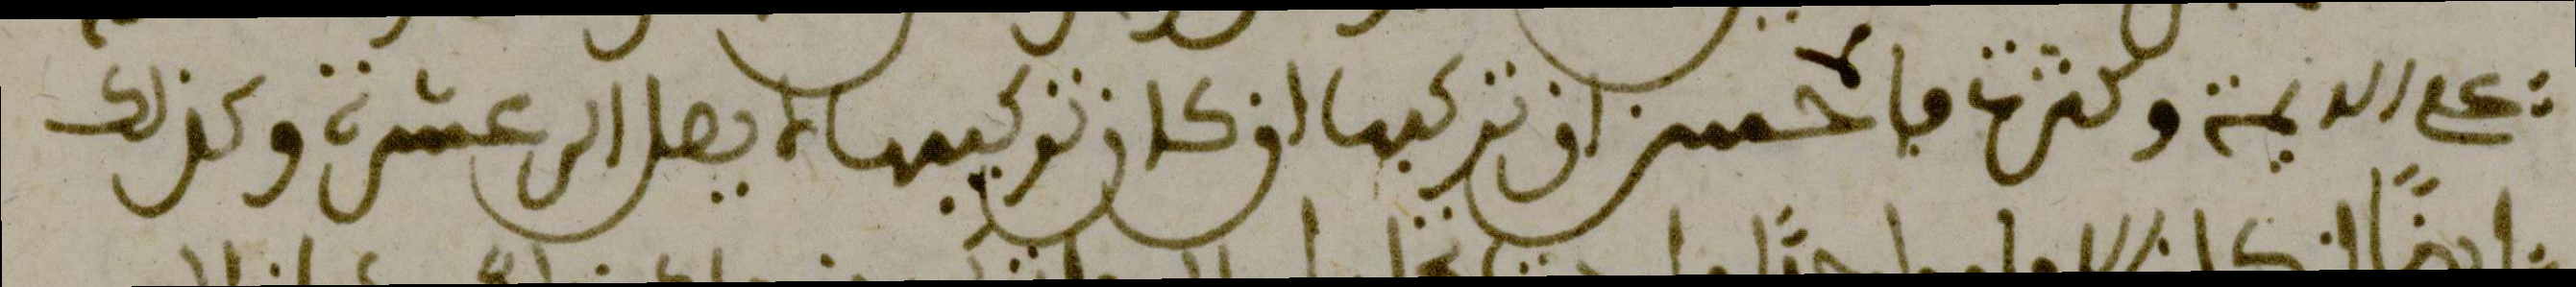على الايمة و كثرت فاحسن ان تركبها ان كان تركيبها لا يصل عشرة و كذلك
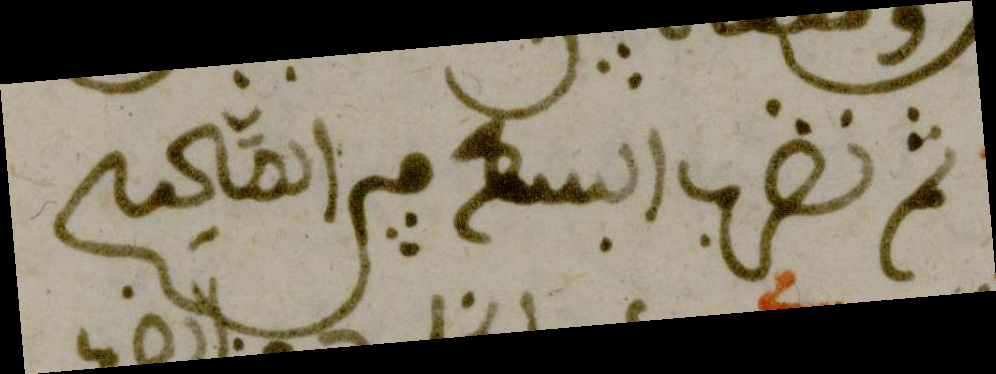ثم تضرب البسط في الصّحيح
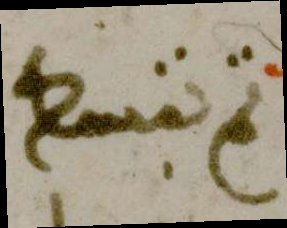ثم تبسط
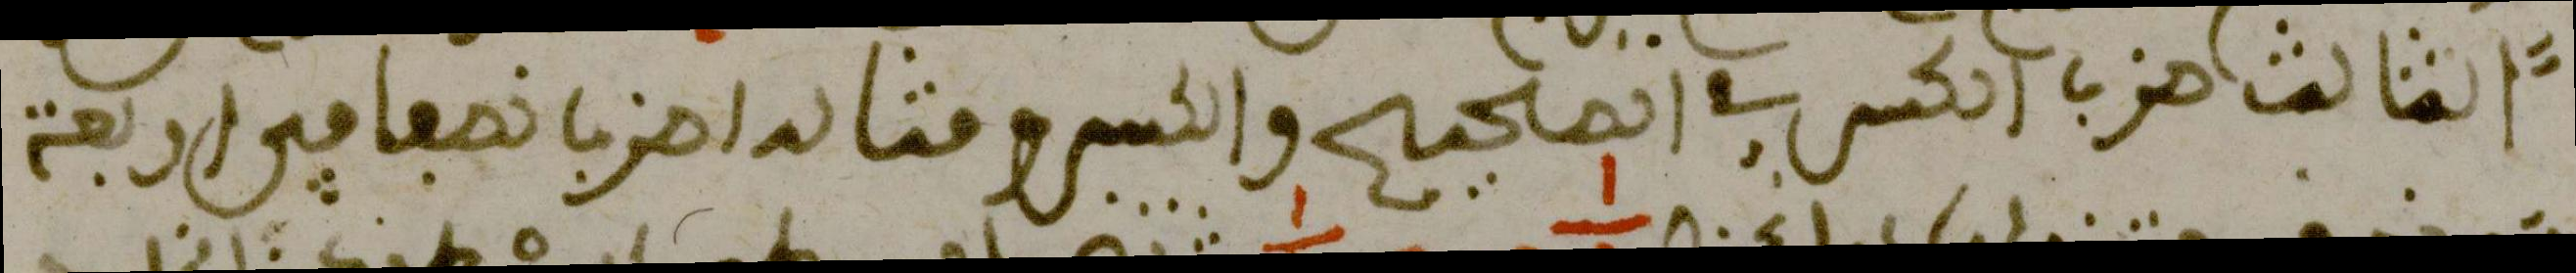الثالث ضرب الكسر في الصحيح و الكسر و مثاله اضرب نصفا في اربعة
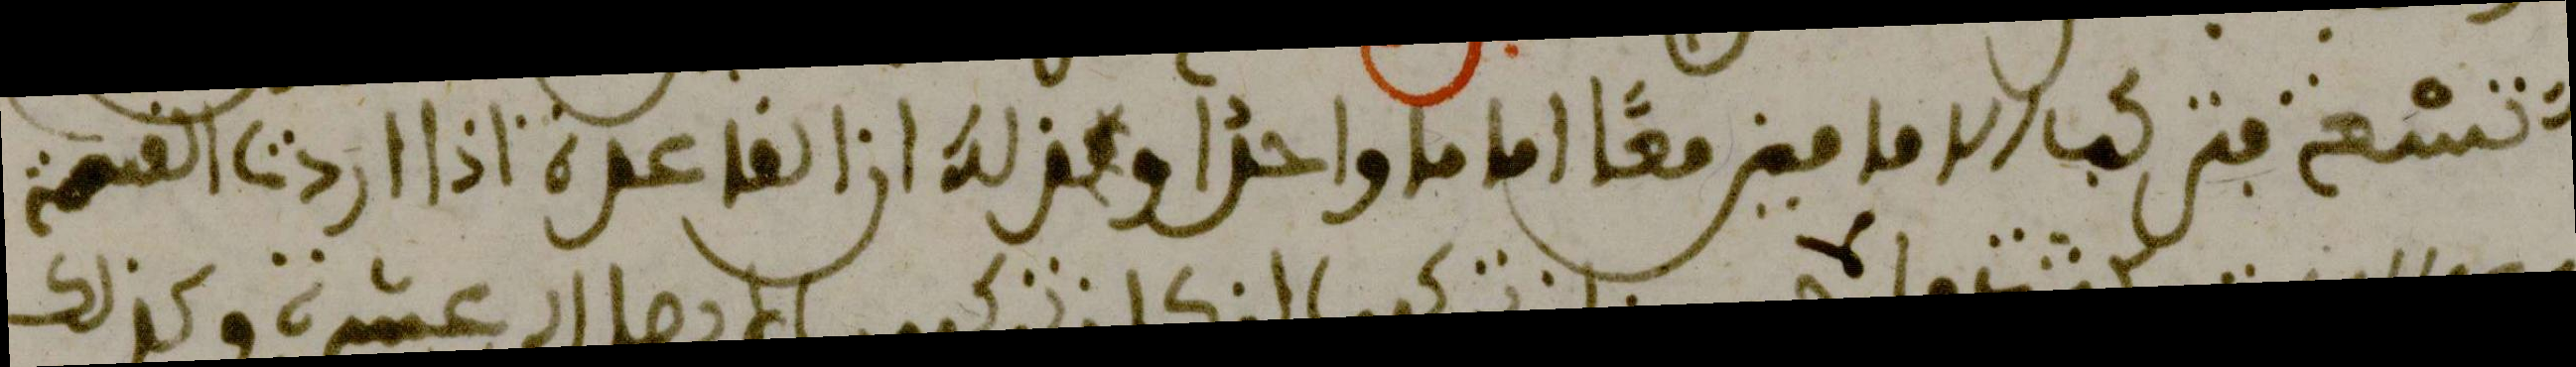تسعة فتركب الامامين معا اماما واحدا و ذلك ان القاعدة اذا اردت القسمة
